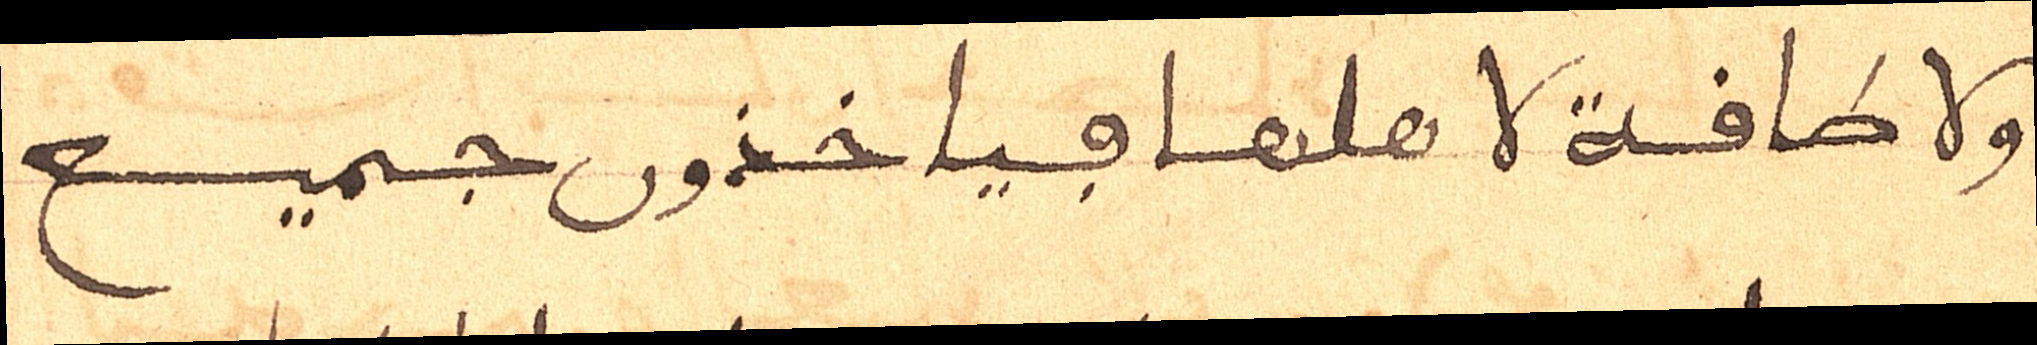ولا طاقة لا هلها فياخذون جميع
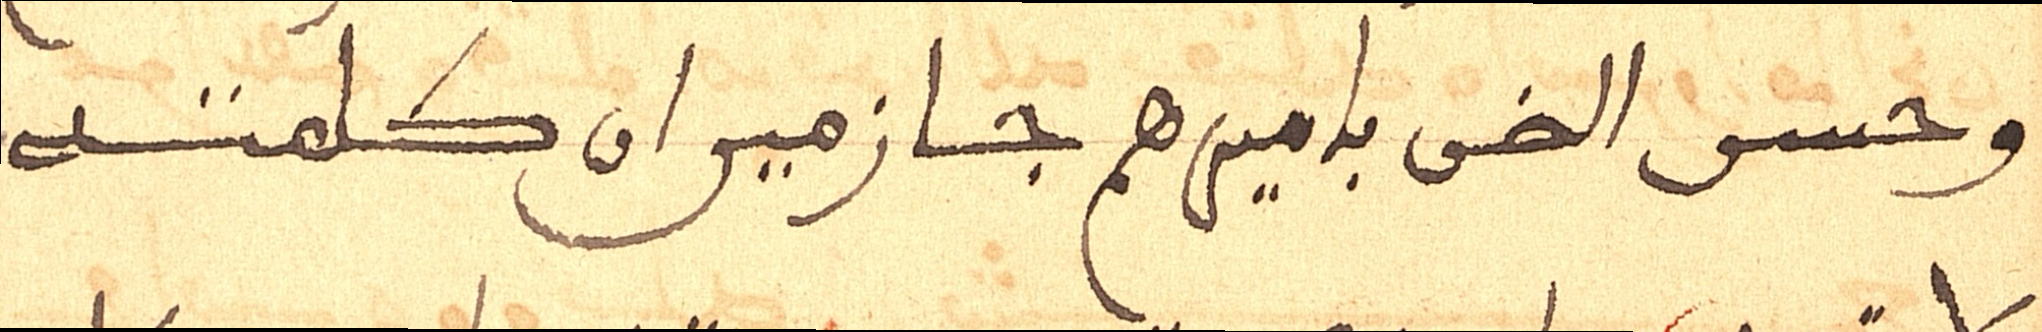وحسن الضن باميرهم جازمين ان كلمته
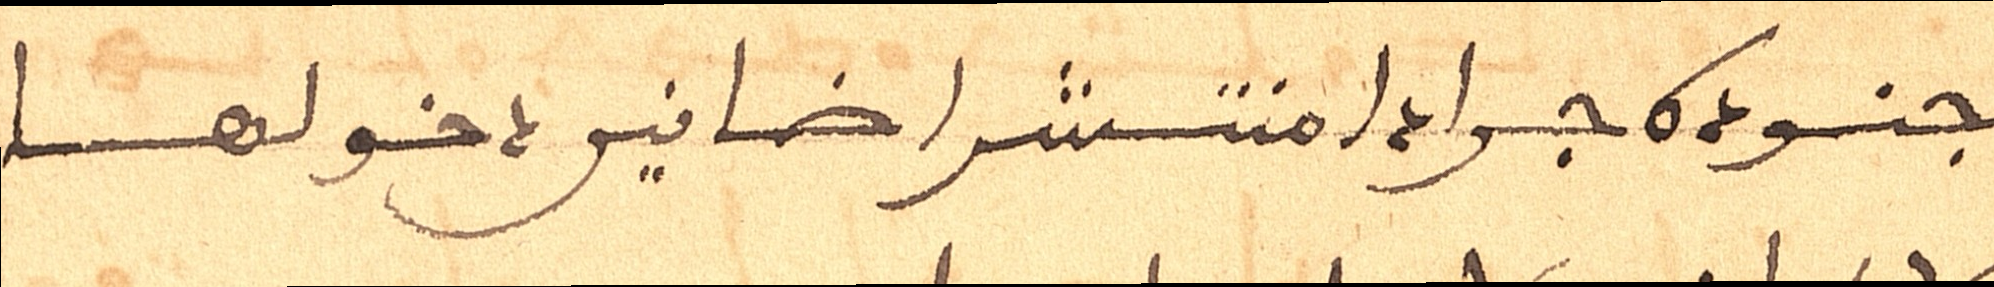جنوده جرادا منتشرا ضانين دخولها
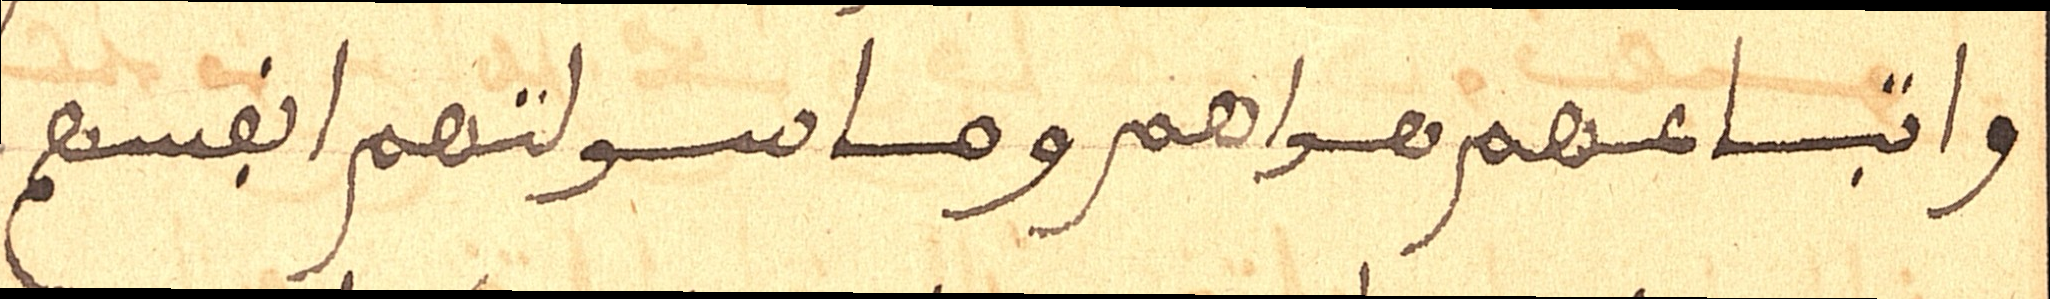واتباعهم هواهم وما سولتهم انفسهم
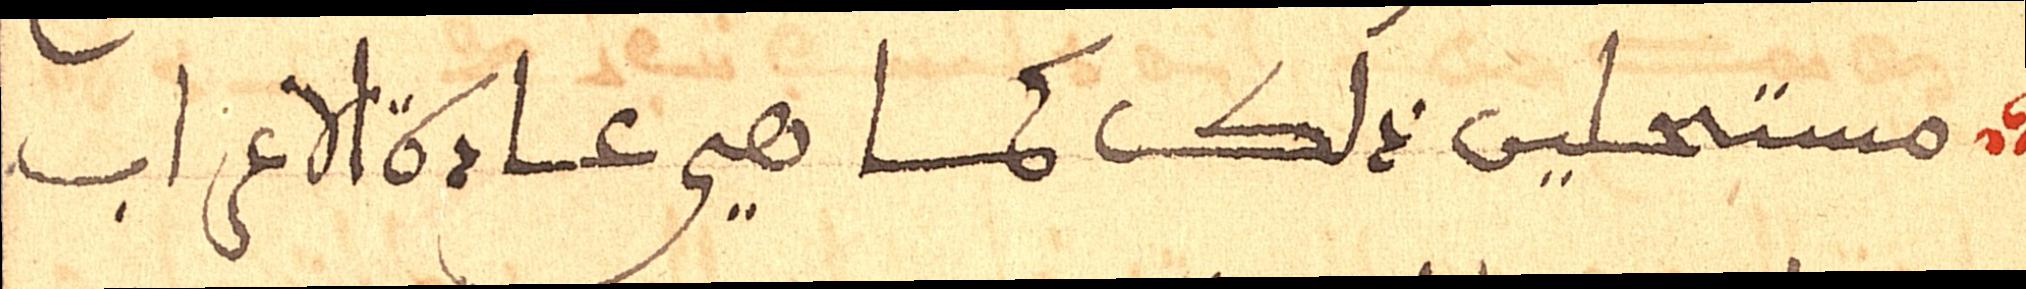مستحلين ذلك كما هي عادة الاعراب
